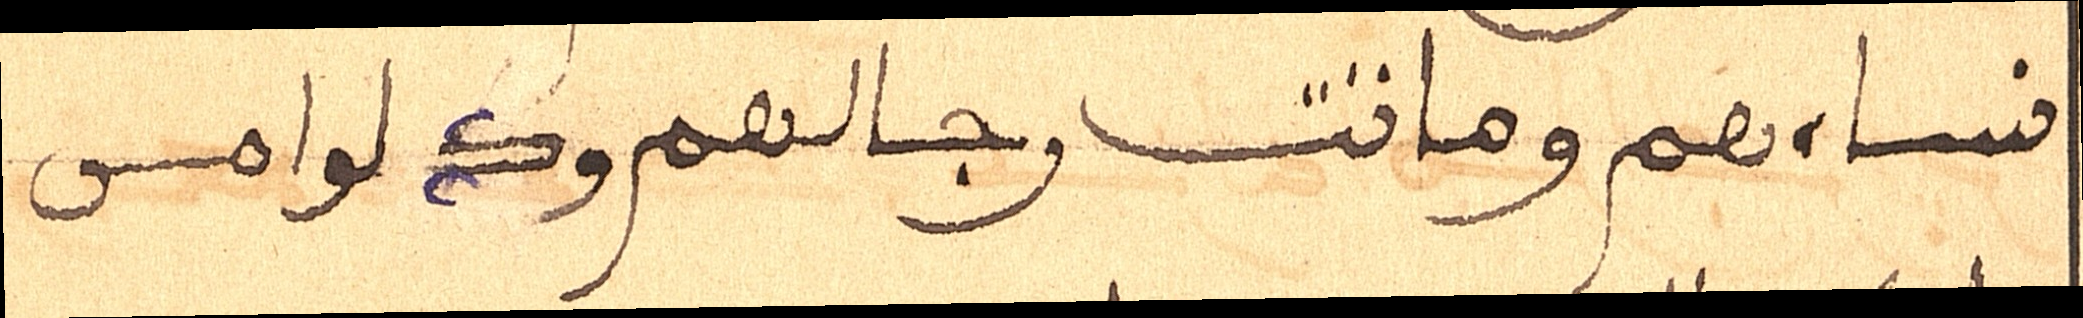نساءهم وماتت رجالهم و# لو امن
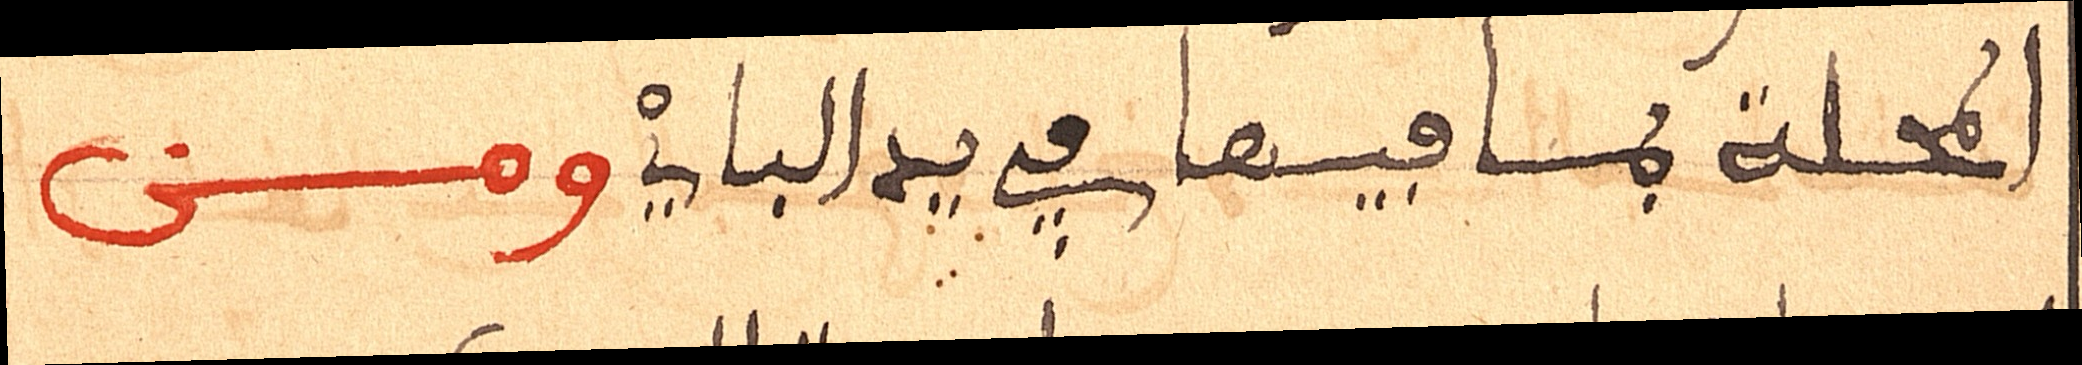المحلة بما فيها في يد الباي ومن
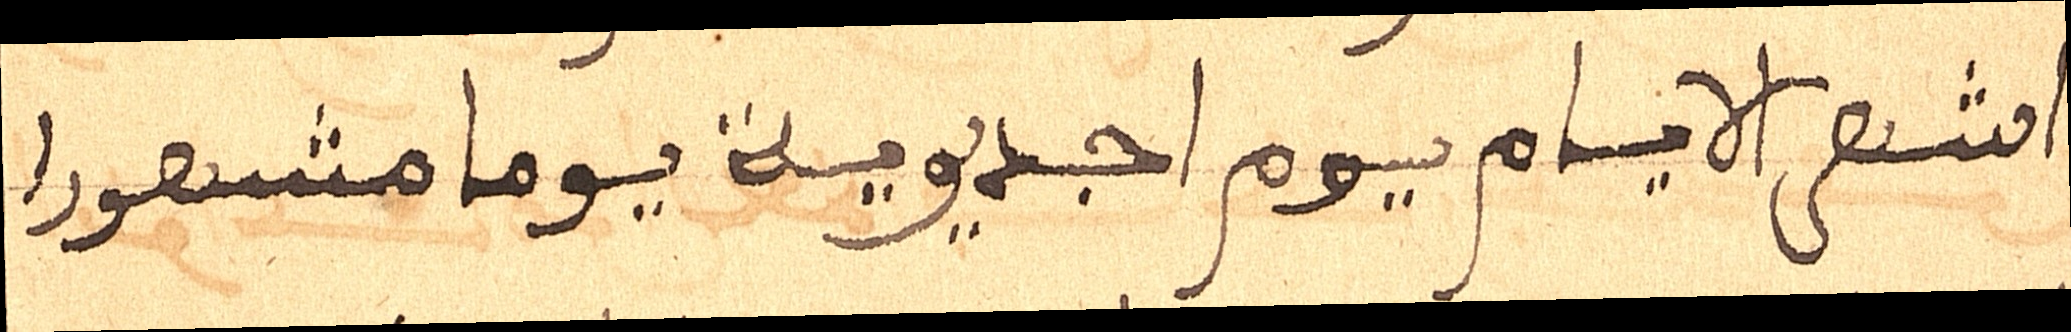اشهر الايام يوم اجديوية يوما مشهورا
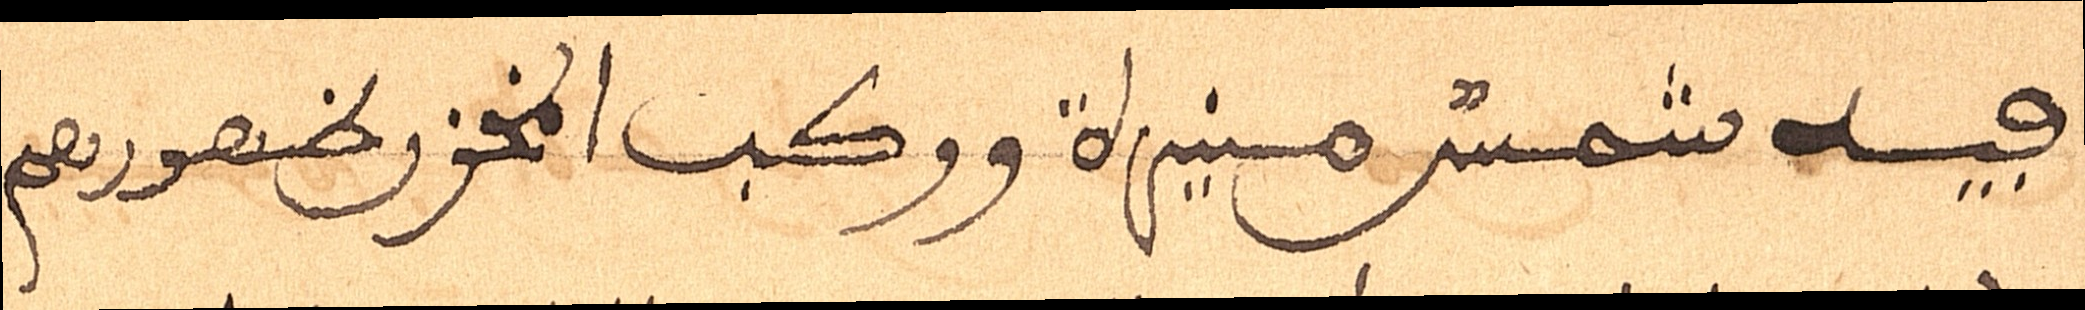فيه شمس منيرة وركب المخزن ظهورهم
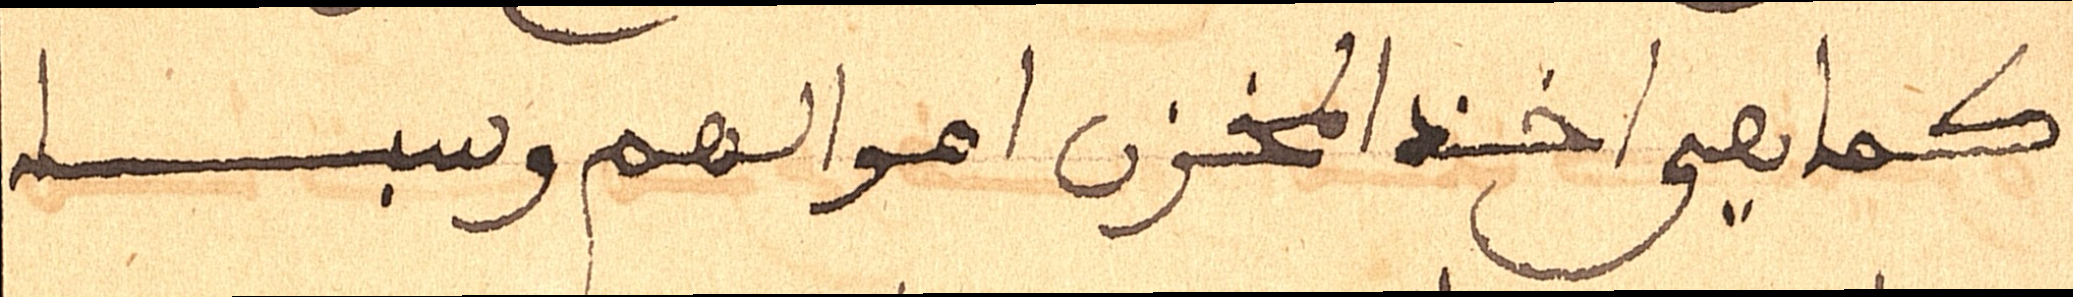كما هي اخذ المخزن اموالهم وسبا
